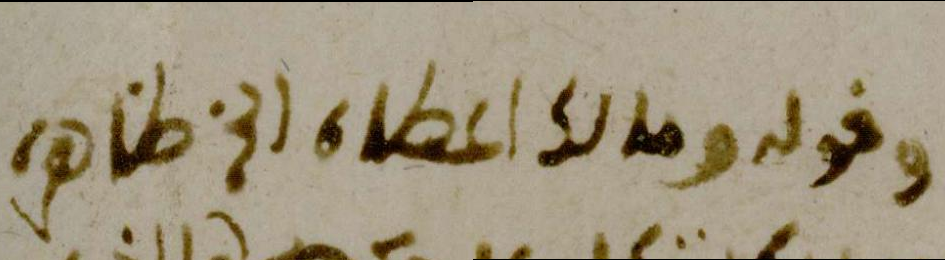وقوله ومالك اعطاه اخر ظاهره
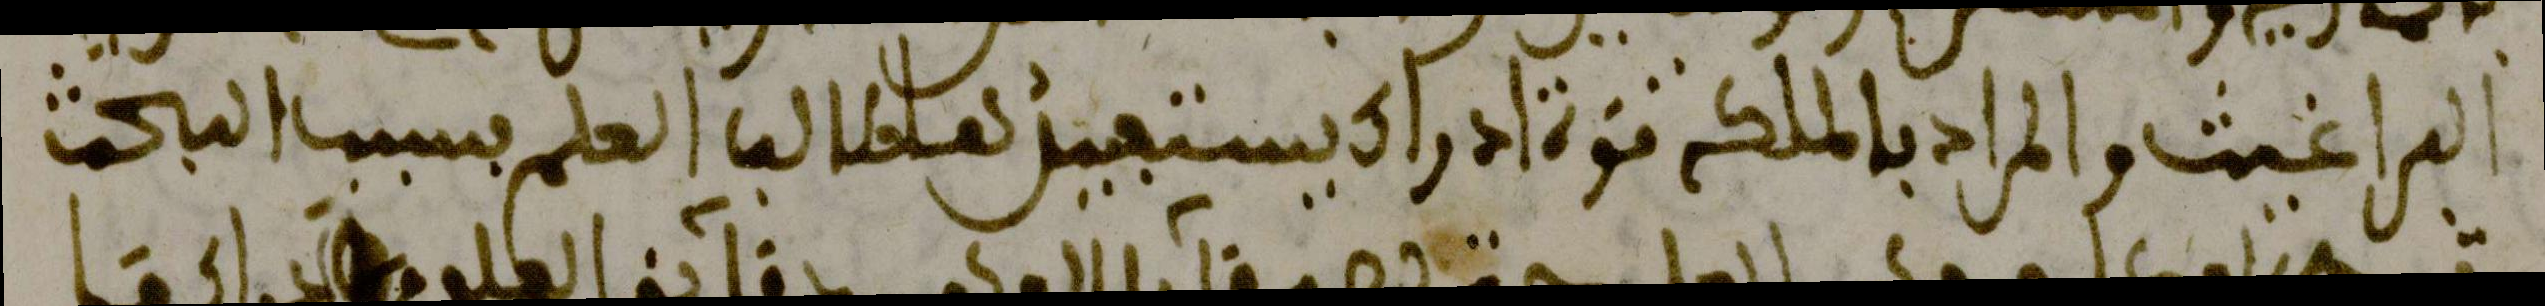البراغيث والمراد بالملكة قوة ادراك يستفيدها طالب العلم بسبب البحث
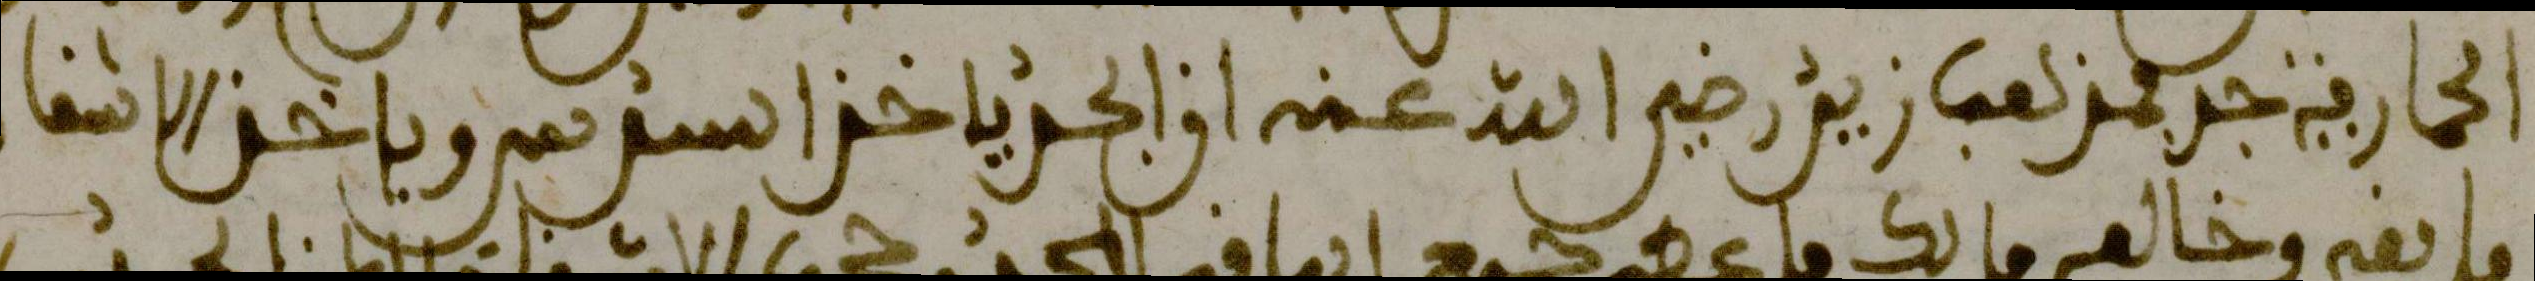الحمارية جد فمذهب زيد رضي الله عنه ان الجد ياخذ السدس وياخذ الاشقا
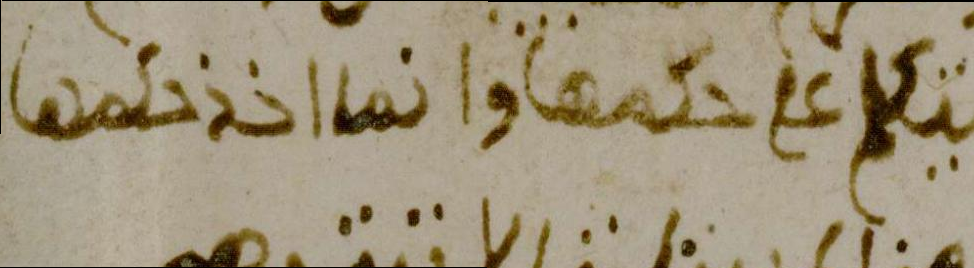يتكلم على حكمها وانما اخذ حكمها
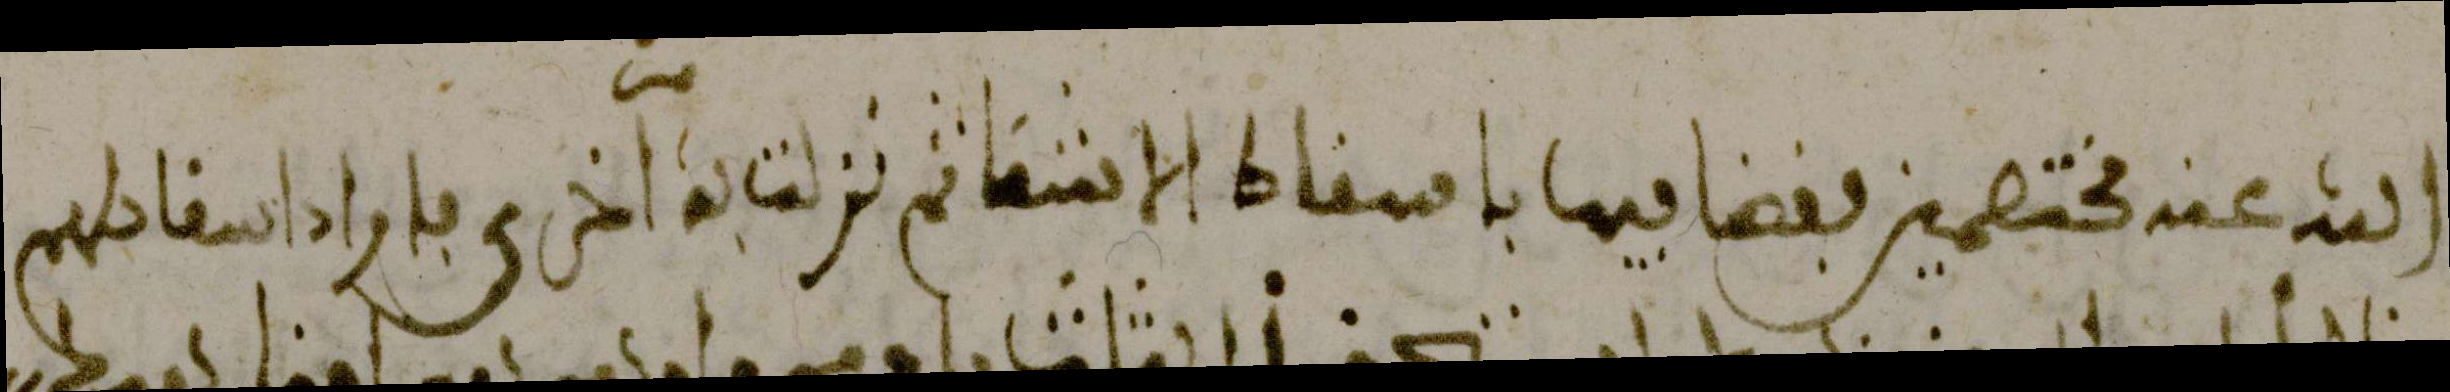الله عنه مختصمين فقضا فيها باسقاط الاشقا ثم نزلت به اخرى فاراد اسقاطهم
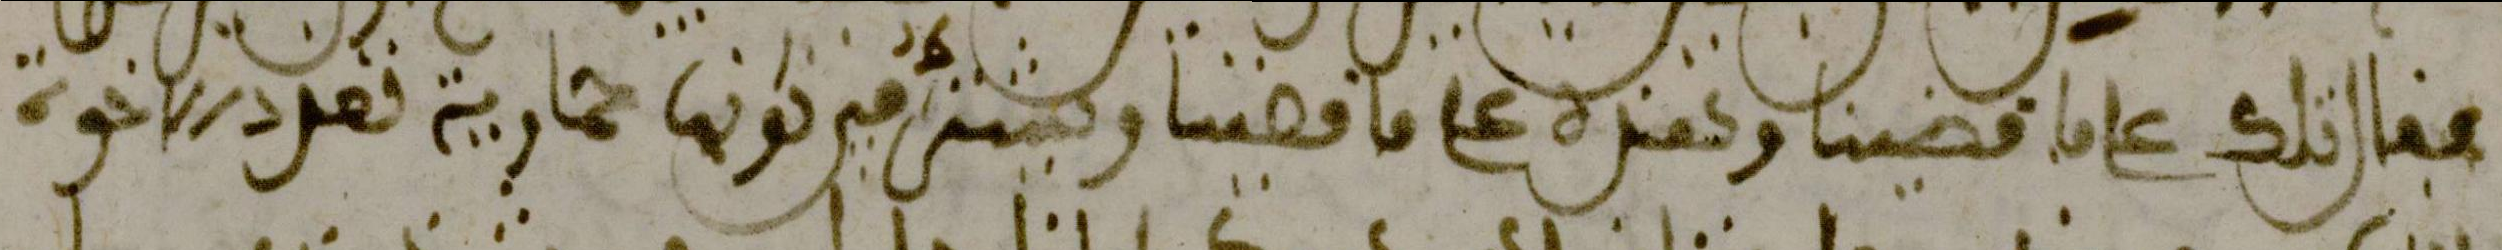فقال تلك على ما قضينا وهذه على ما قصينا ويشترط في كونها حمارية تعدد الاخوة
